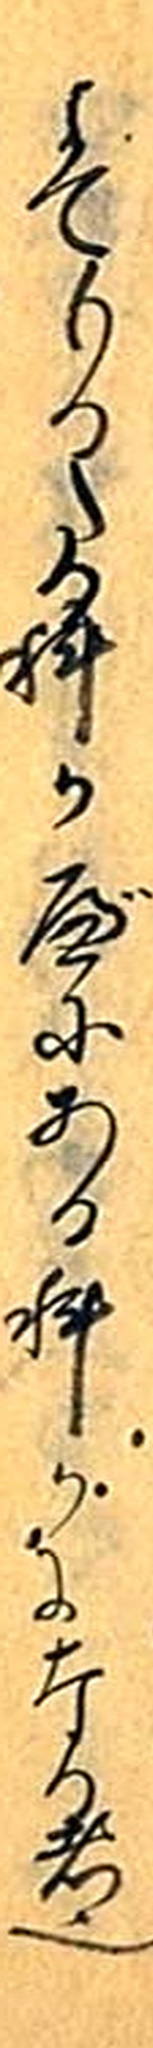よてもるたる科かべにある科かになる者也
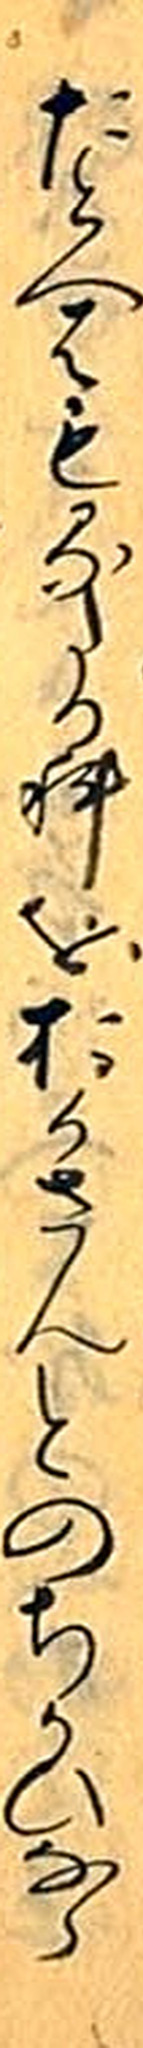たとへはもるたる科をおかさんとのちかひなら
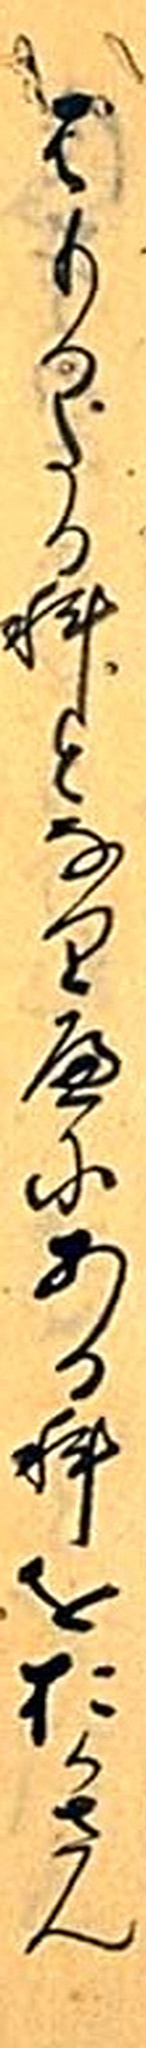はもるたる科となりへにある科をおかさん
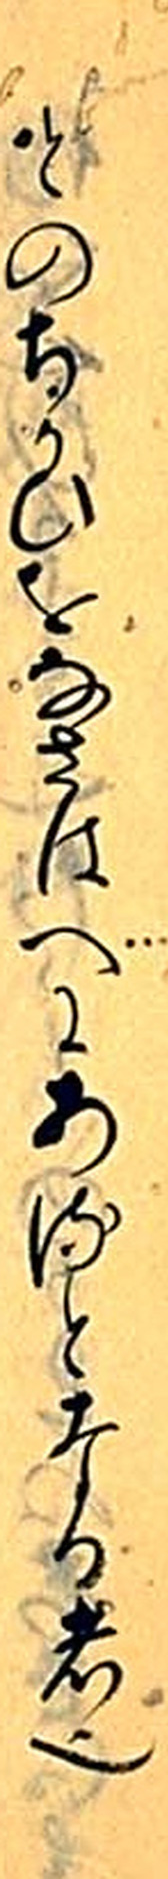とのちかひをなさはべにあるとなる者也
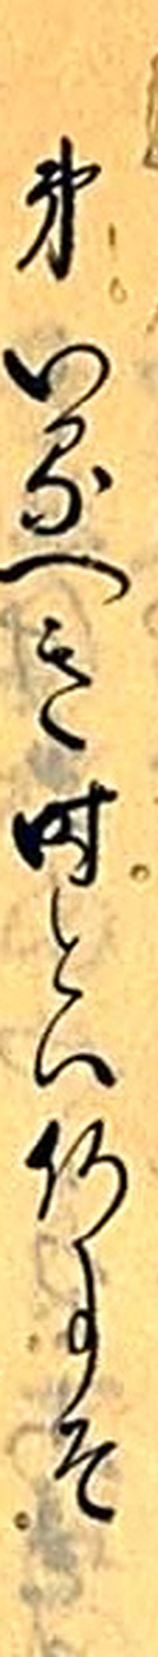弟いるへき時とは何事そ
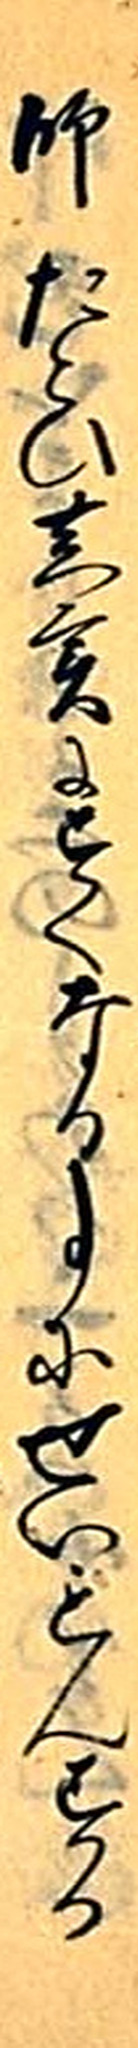師たとひ真実にすくなる事にせいもんする
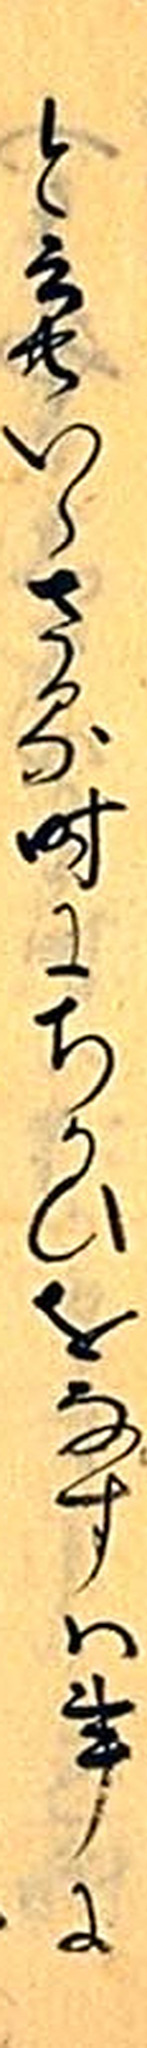と云共いらさるとき時にちかひをなすは事に
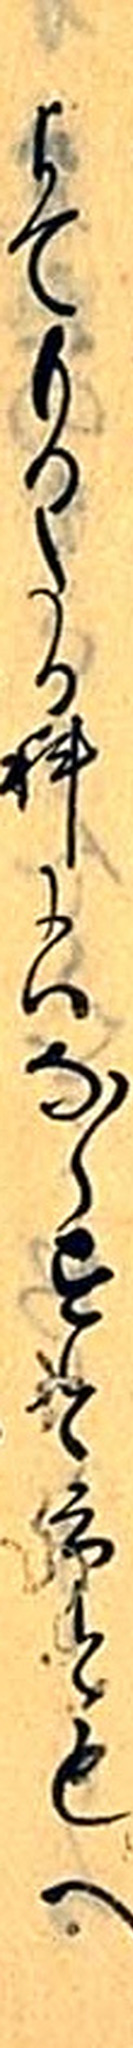よてもるたる科にはならすと云ともへ
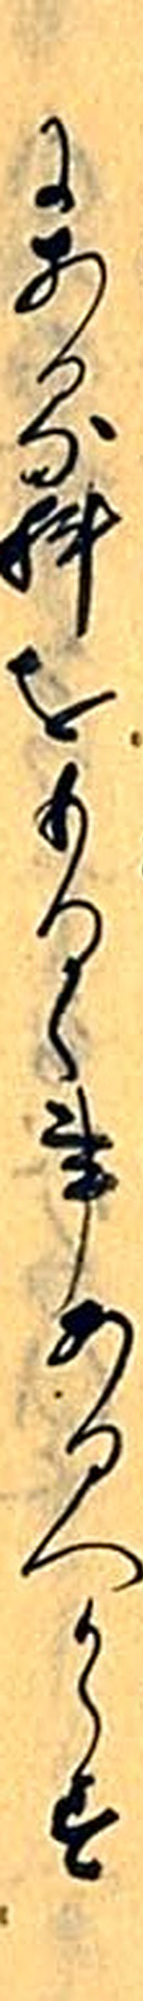にある科をもるゝ事あるへからす
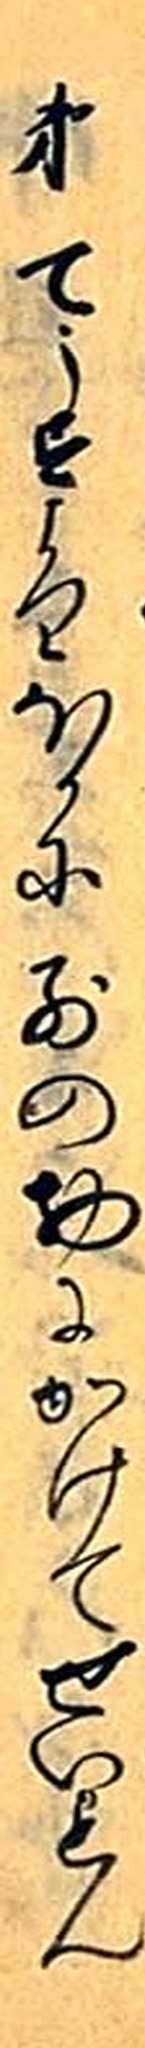弟てうすよりほかに別の物にかけてせいもん
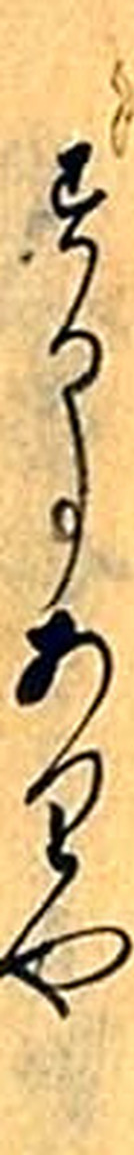する事ありや
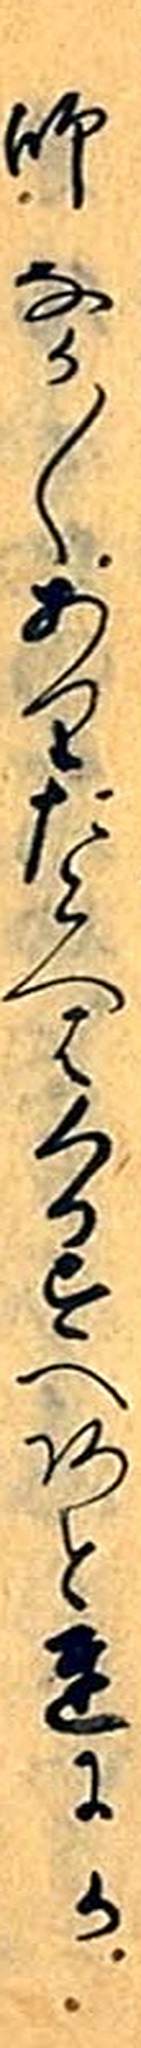師なか〳〵ありたとへはくるすへあと達にか
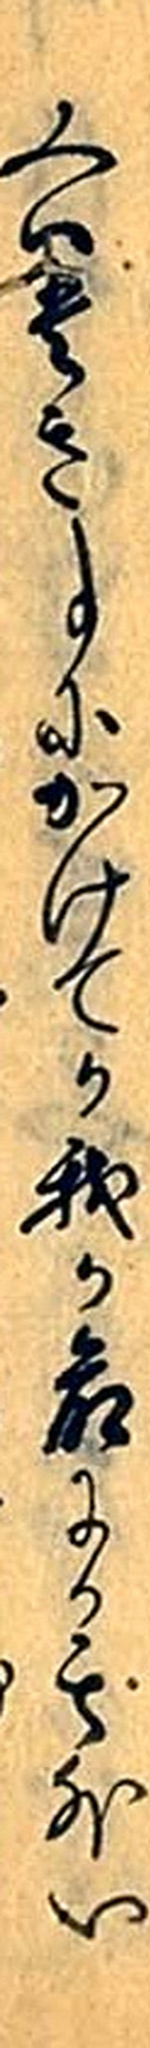又は貴き事にかけてか我か命にか其外い
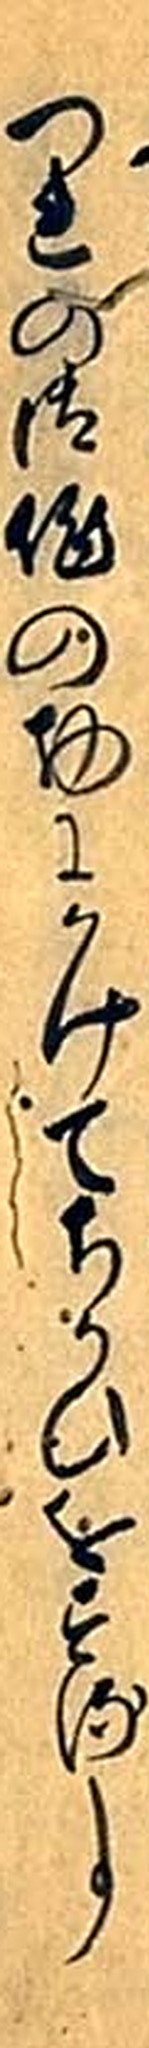つれの御作の物にかけてちかひをする事
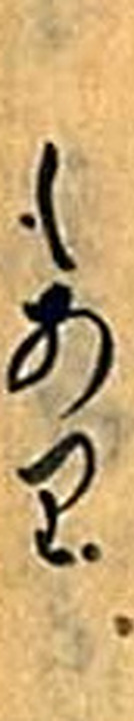もあり

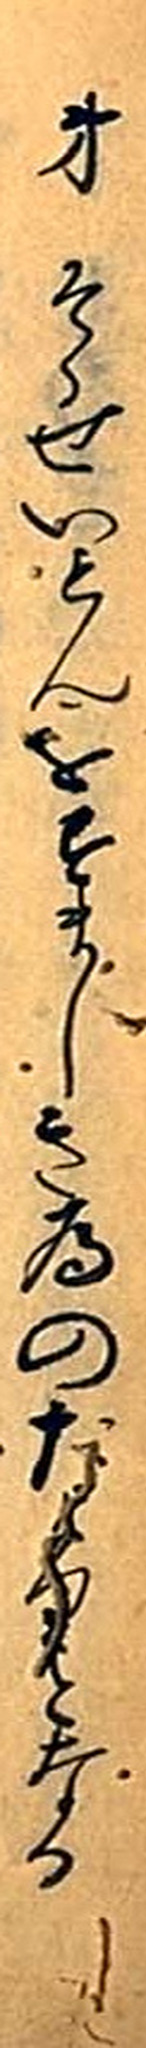弟そらせいもんをすましき為にたよりとなる
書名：ドチリナ・キリシタン
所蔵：東京大学総合図書館 / General Library in the University of Tokyo
